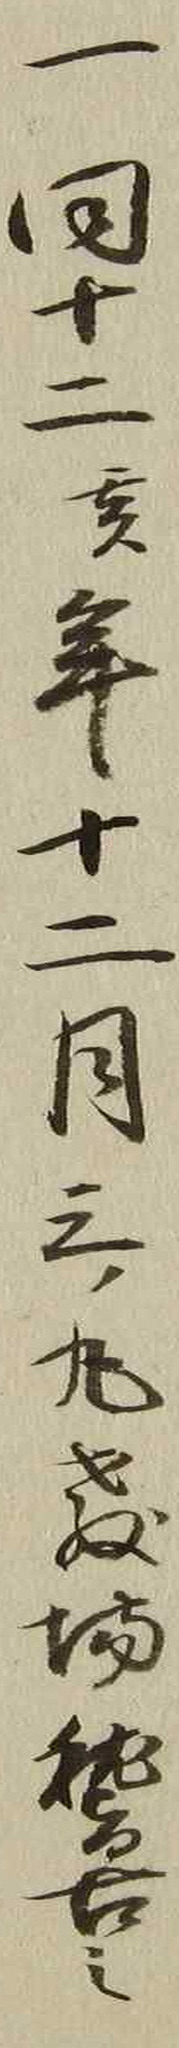一同十二亥年十二月三ノ丸教場之
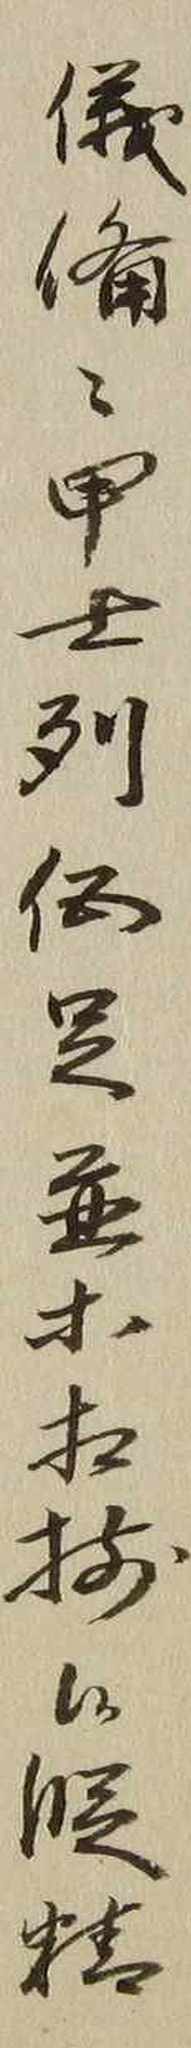儀脩々甲士列伍足並等相揃候段精
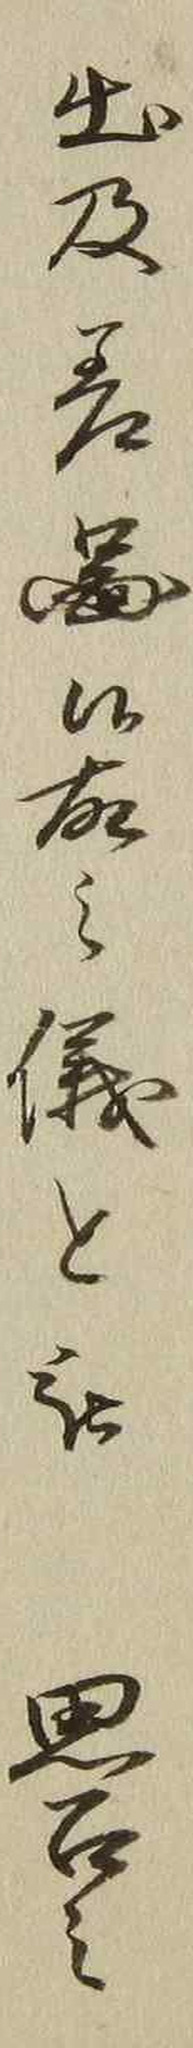出及差図候故之儀と被思召之
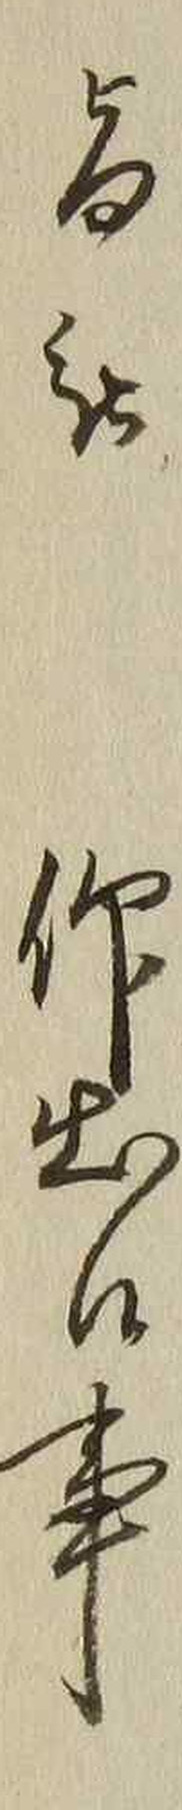旨被仰出候事
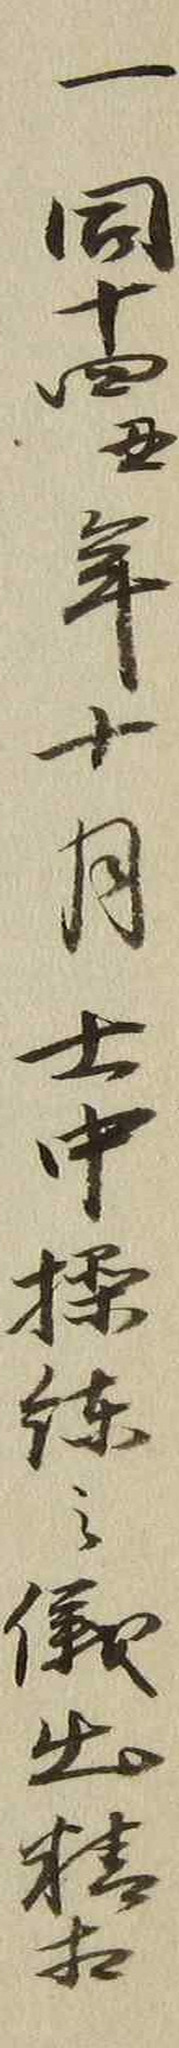一同十四丑年十月士中操錬之儀出精相
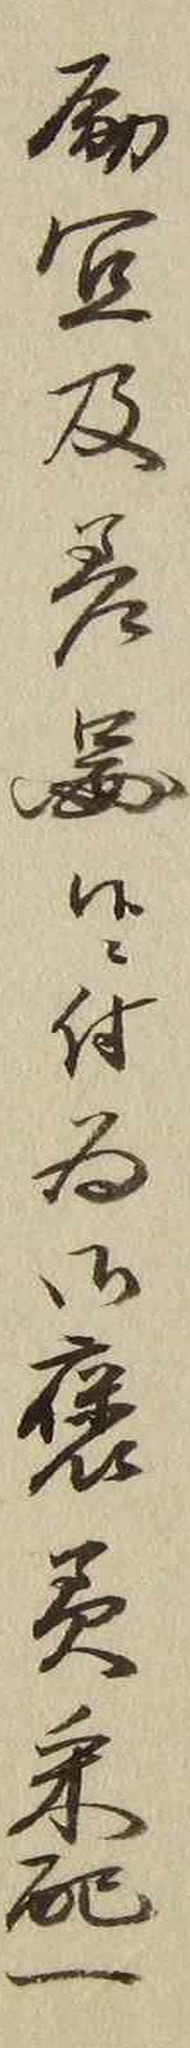励宜及差図候に付為御褒美采配一
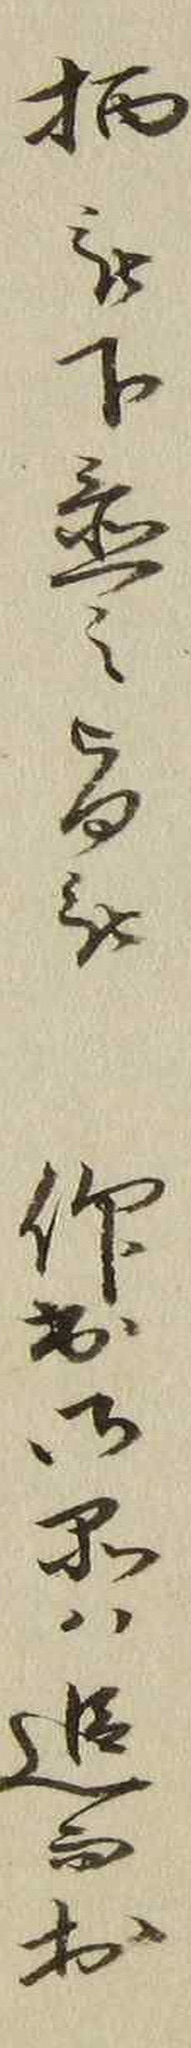柄被下置之旨被仰出御品は追而於
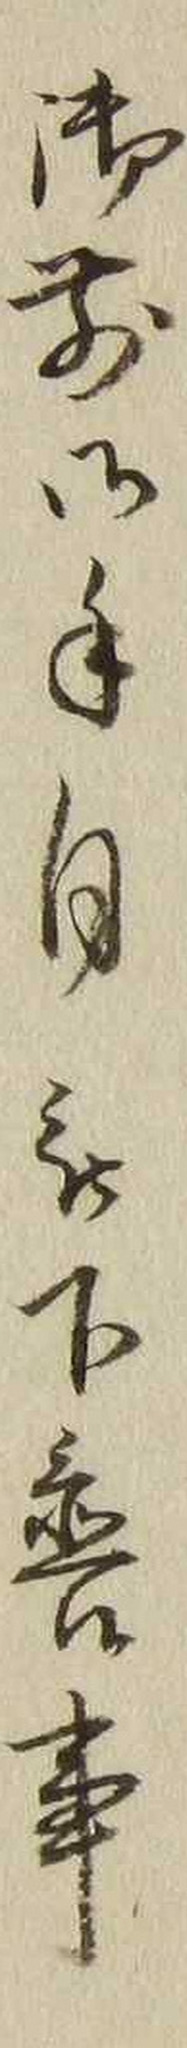御前御手自被下置候事
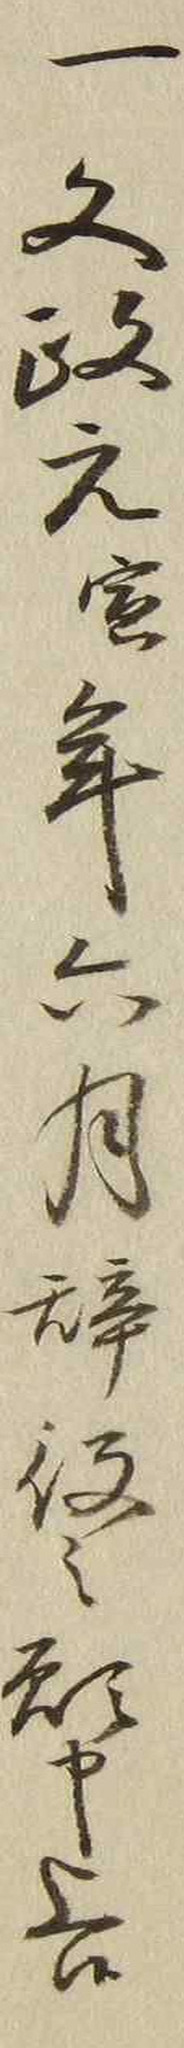一文政元寅年六月辞役之願申上候
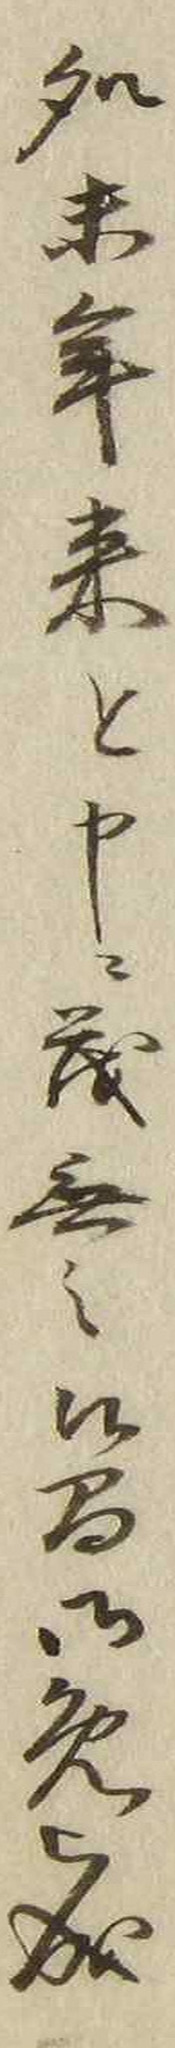処未年来と申にも無之候間御免被成
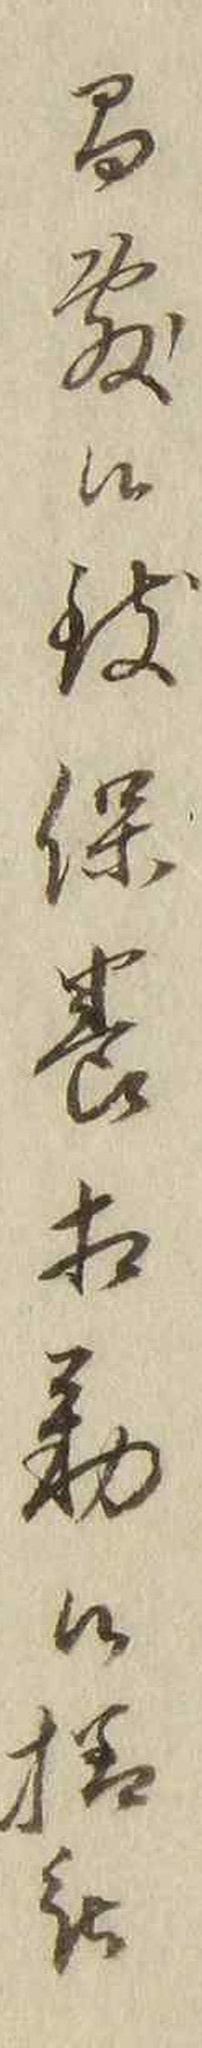間敷候致保養相勤候様被

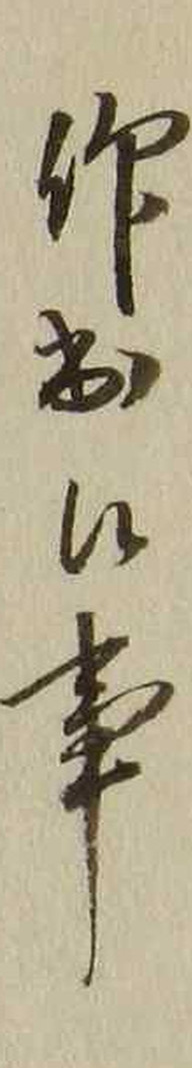仰出候事
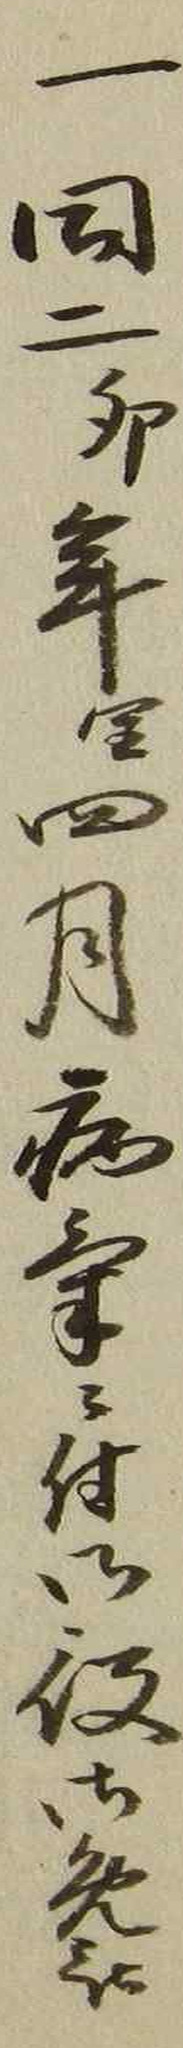一同二卯年閏四月病気に付御役御免被
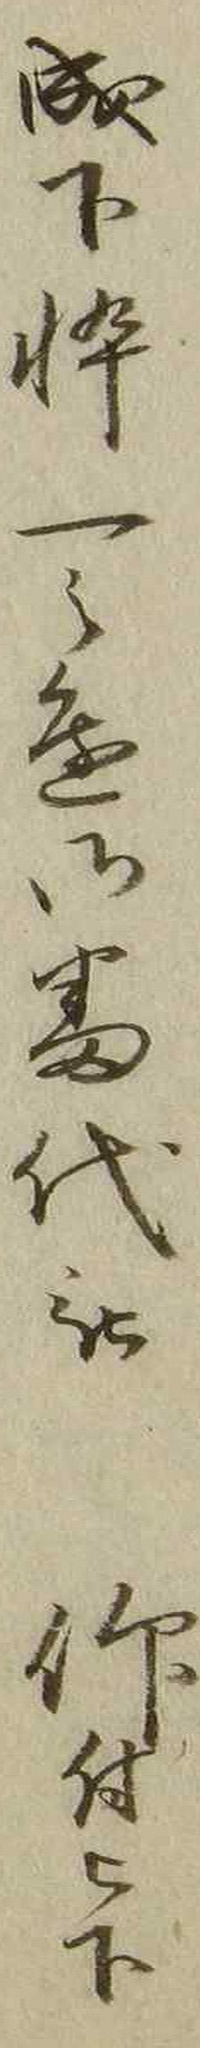成下忰一之進御番代被仰付被下
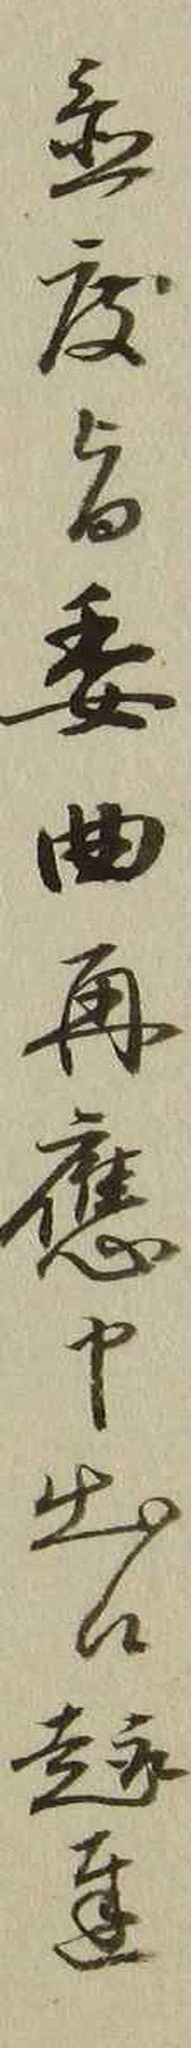置度旨委曲再応申出候趣達
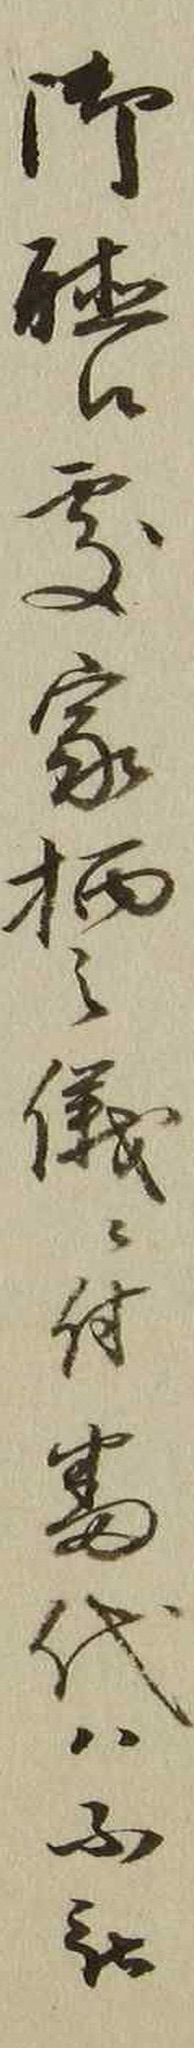御聴候処家柄之儀に付番代は不被
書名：諸士系譜　巻之133　た之部9
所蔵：会津若松市立会津図書館
